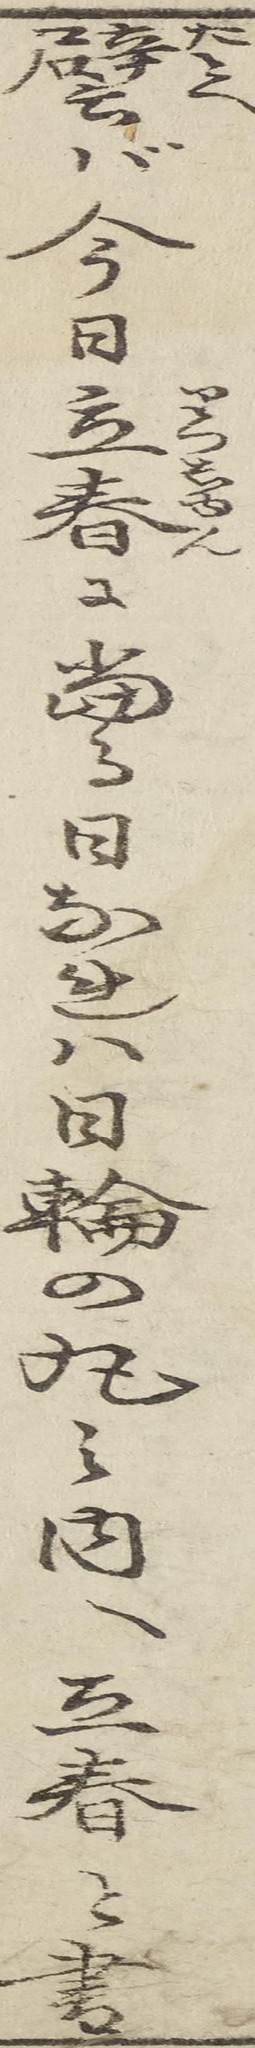譬ば今日立春に当る日なれは日輪の丸之内へ立春と書
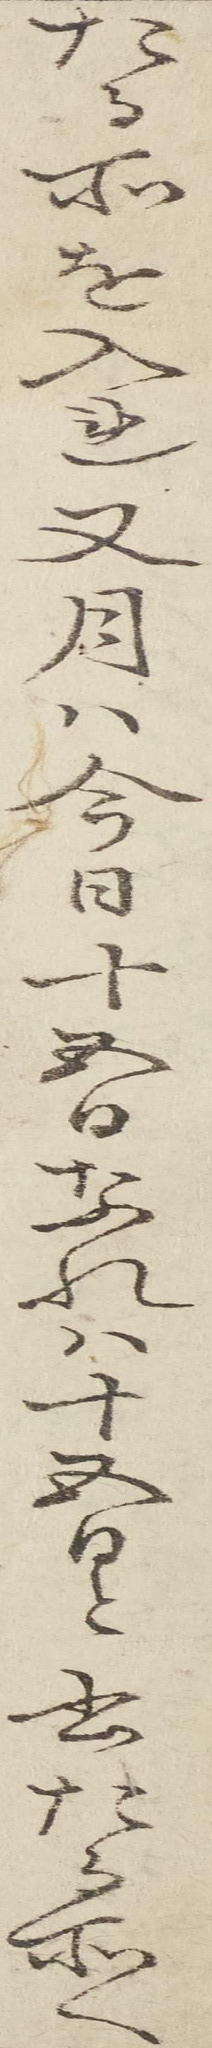たる所を入れ又月は今日十五日なれは十五日と書たる所へ
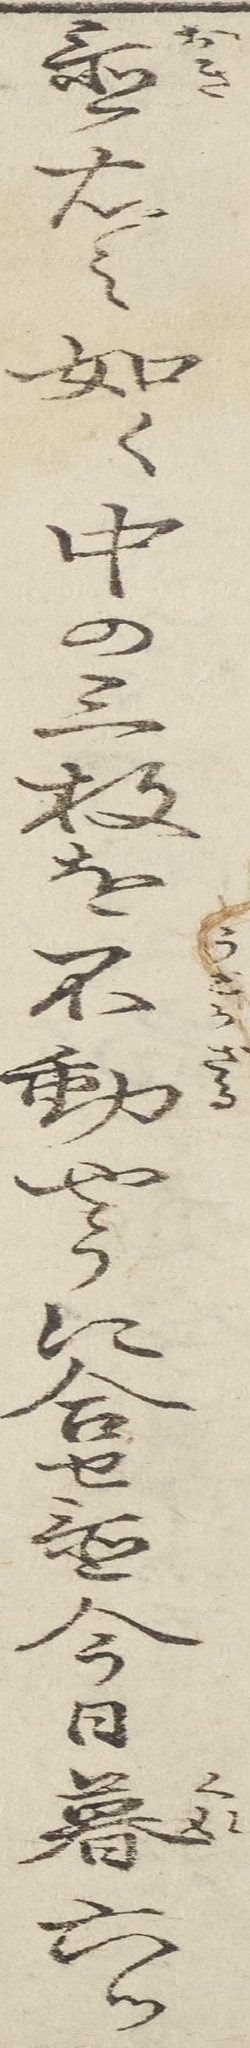置右之如く中の三枚を不動やうに合せ置今日暮六つ
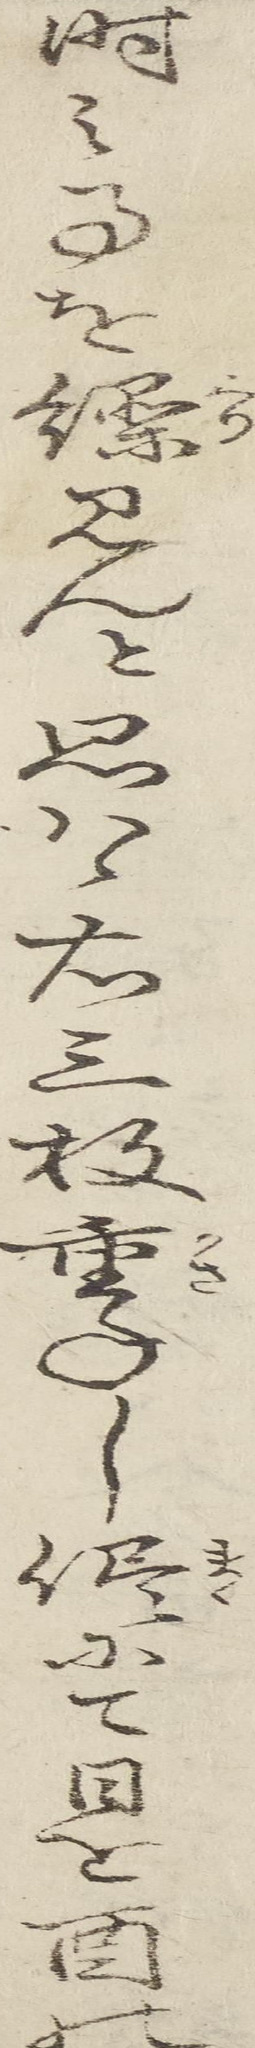時之事を繰見んと思はゝ右三枚重ねし侭にて日を酉の
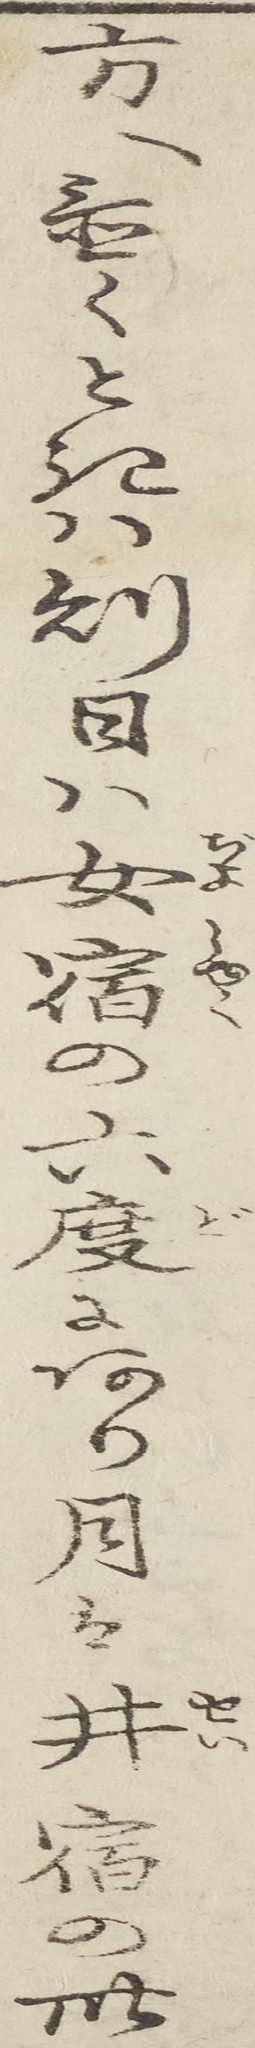方へ置くときは則日は女宿の六度にあり月は井宿に丗
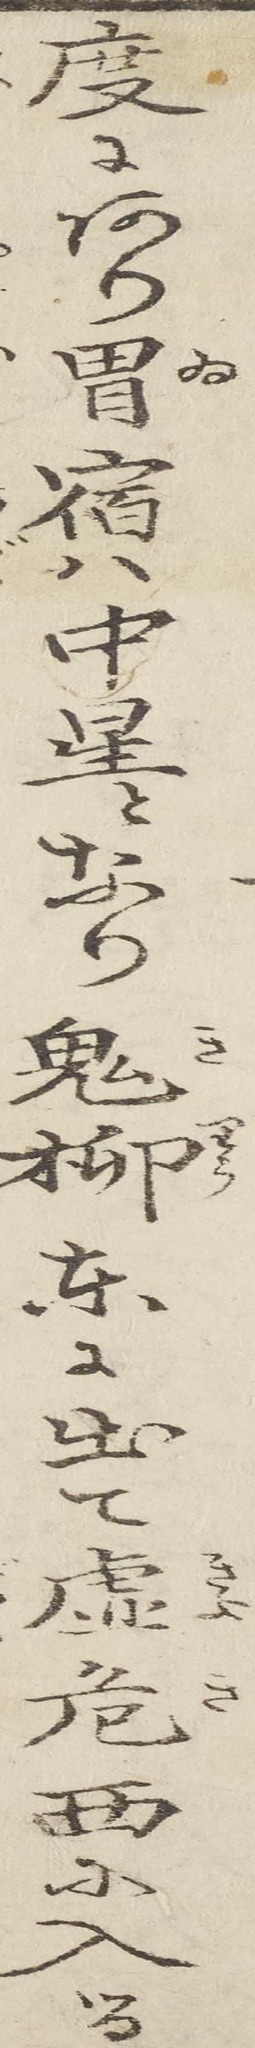度にあり胃宿は中星となり鬼柳東に出て虚危西に入る
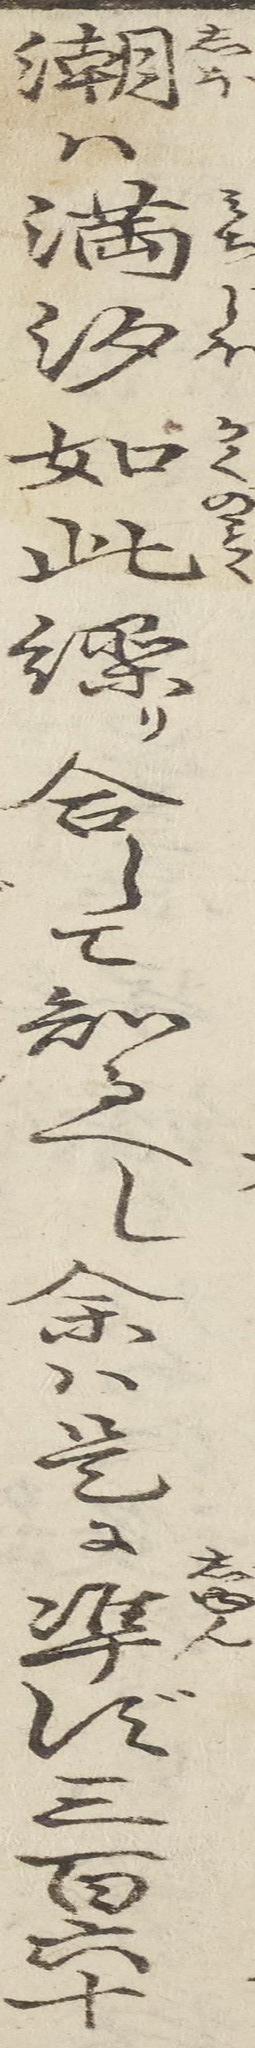潮は満汐如此繰り合して知るへし余は是に準ず三百六十
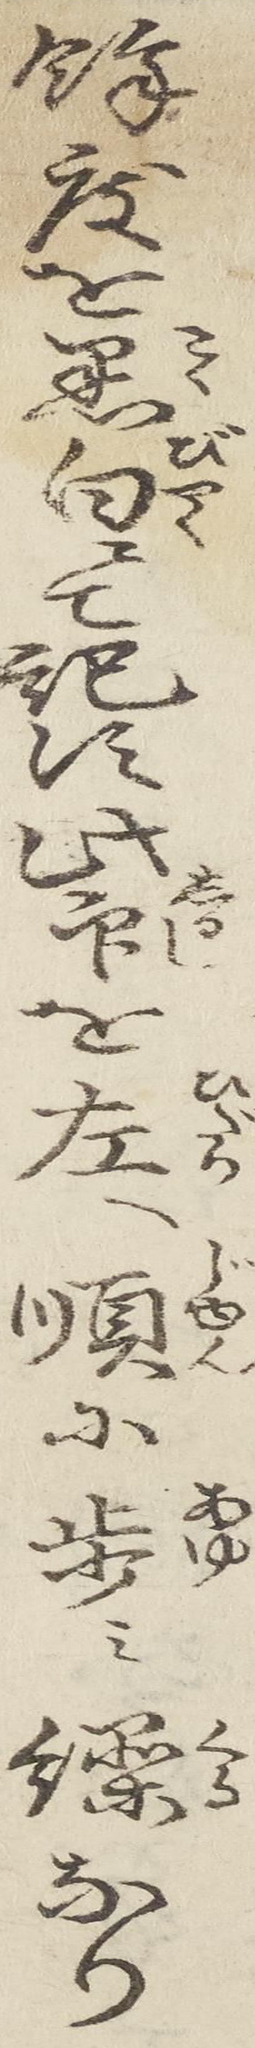余度を黒白ニて記す此印を左へ順に歩み繰なり
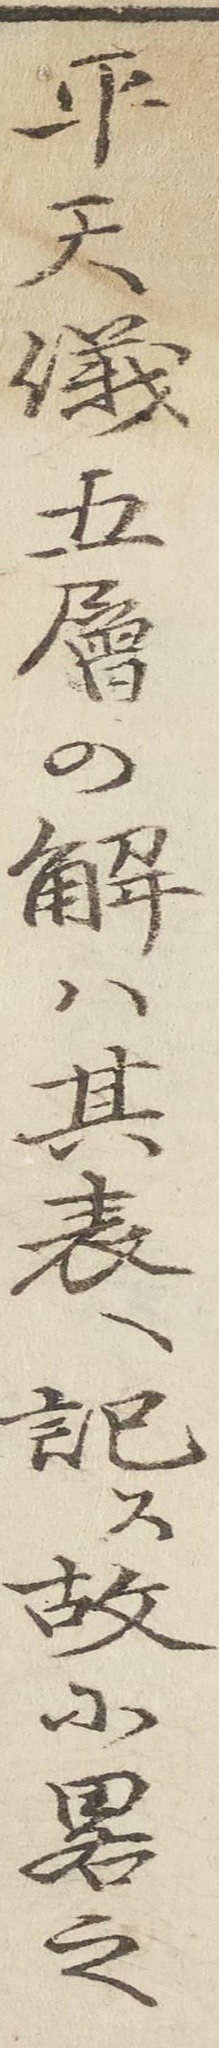平天儀五層の解は其表へ記ス故に略之
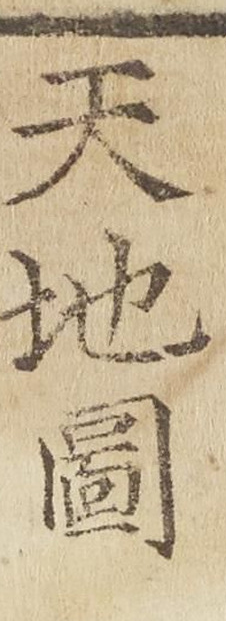天地図
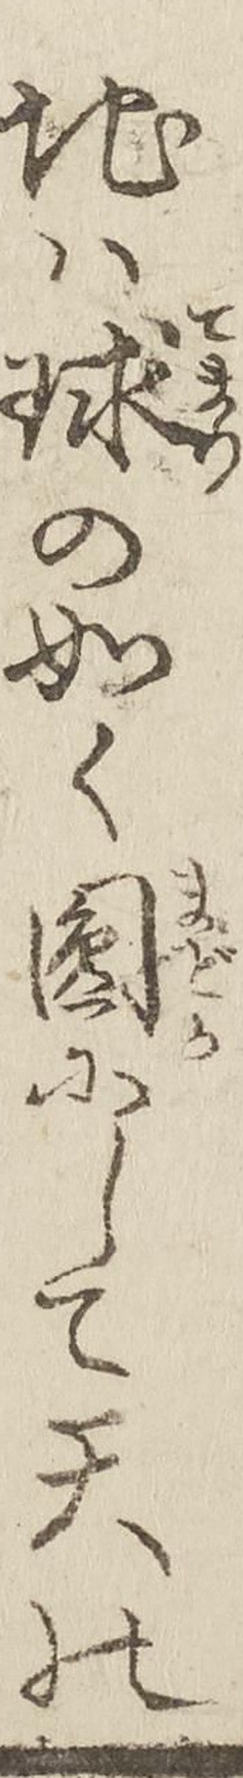地球は球の如く円にして天の
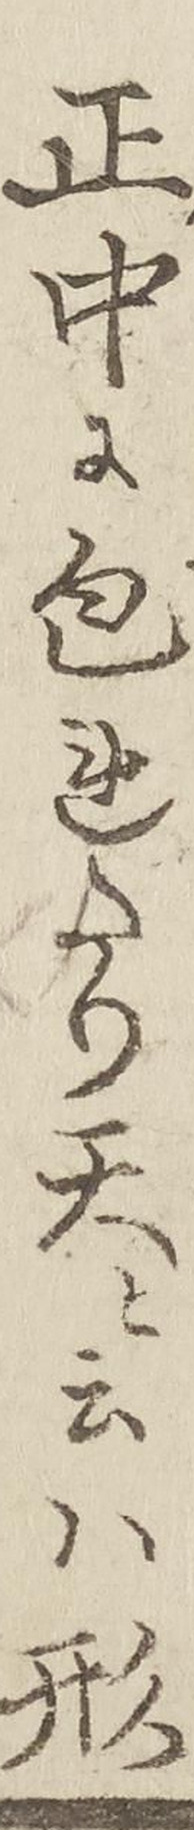正中に包れたり天と云は形
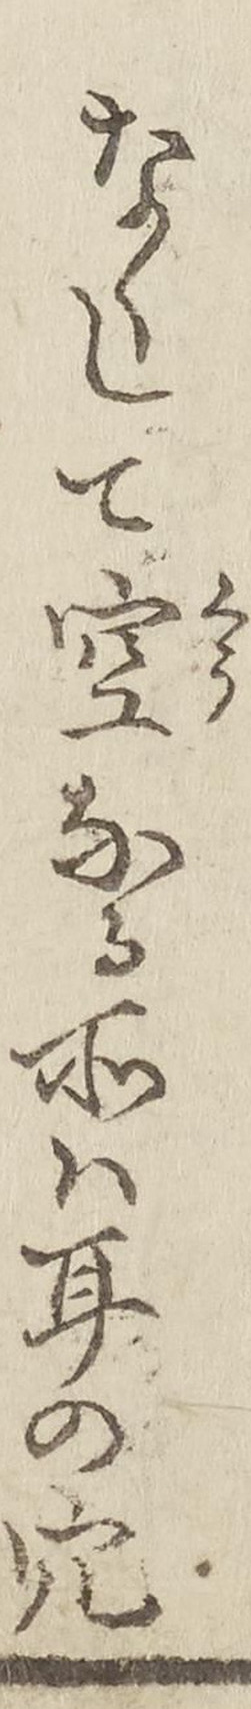なくして空なる所は耳の穴
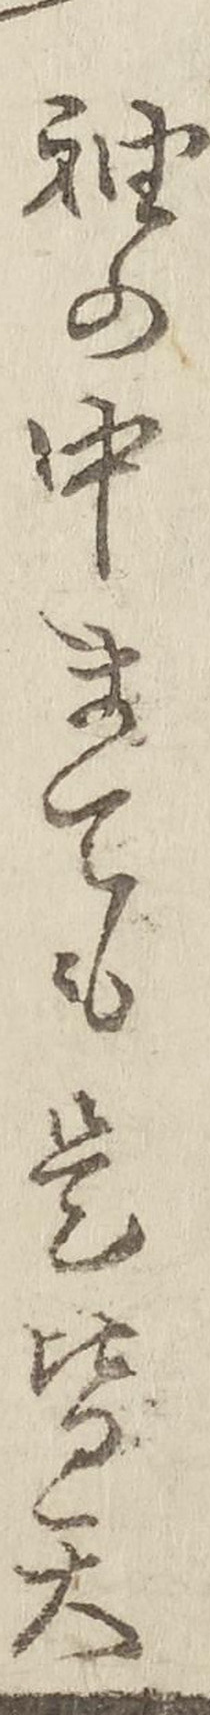袖の中まても是皆天
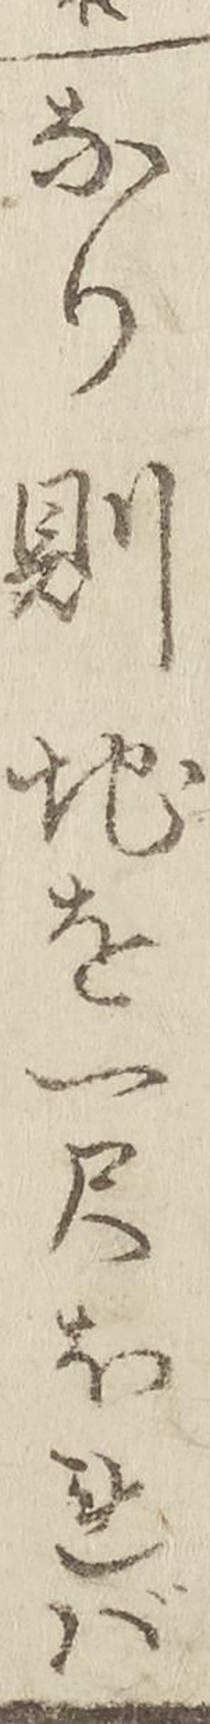なり則地を一尺ほれば
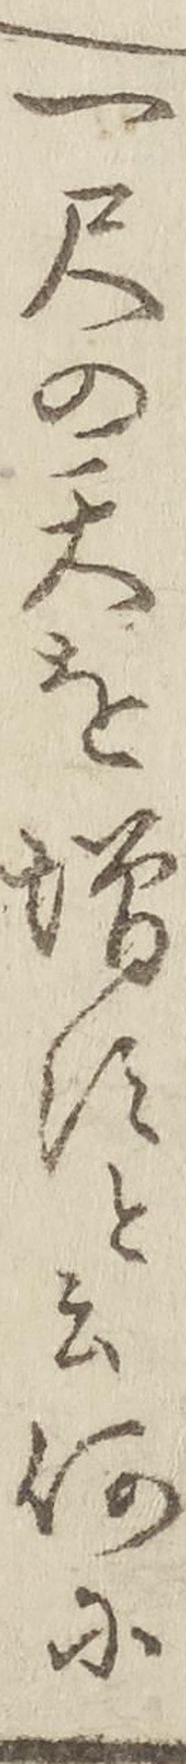一尺の天を増すと云何に
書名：平天儀圖解
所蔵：東京大学地震研究所図書室 Earthquake Research Institute Library, The University of Tokyo, JAPAN
